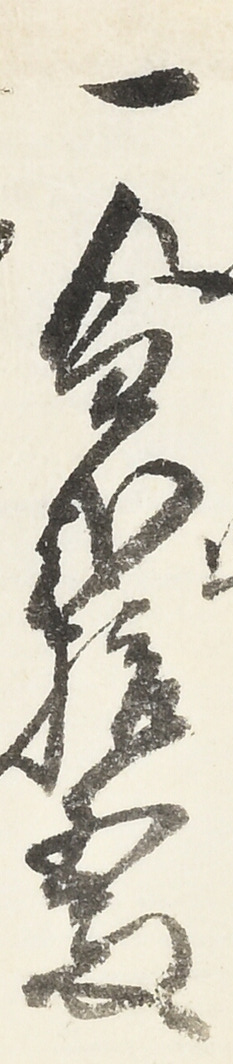一金弐拾五両
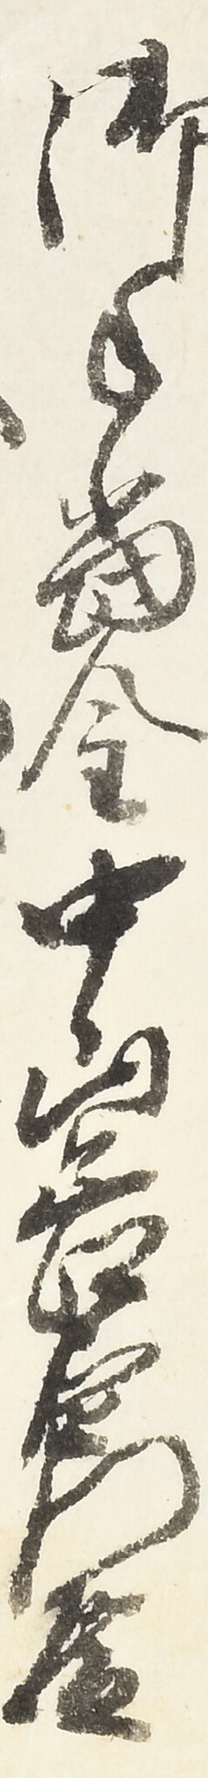御手当金中山善右衛門殿
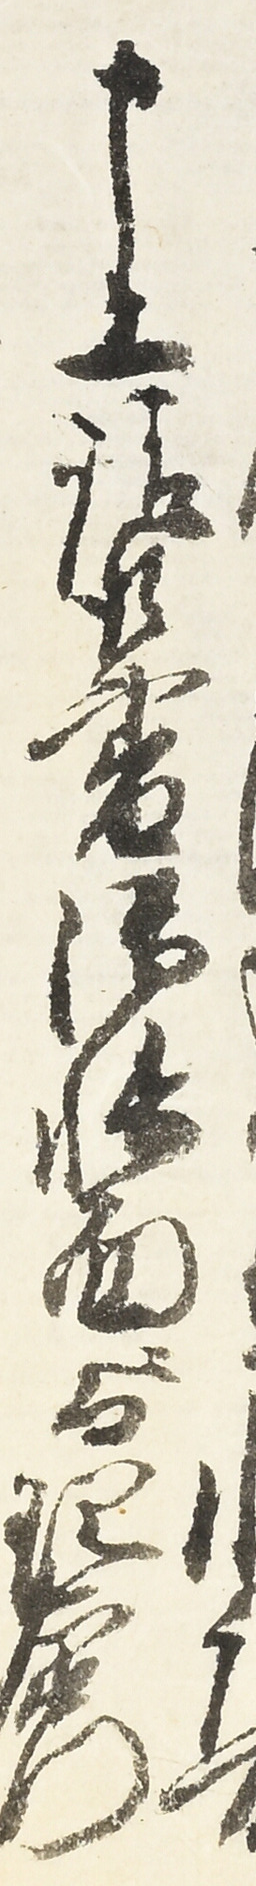申上請取書御帳面ニ而理右衛門
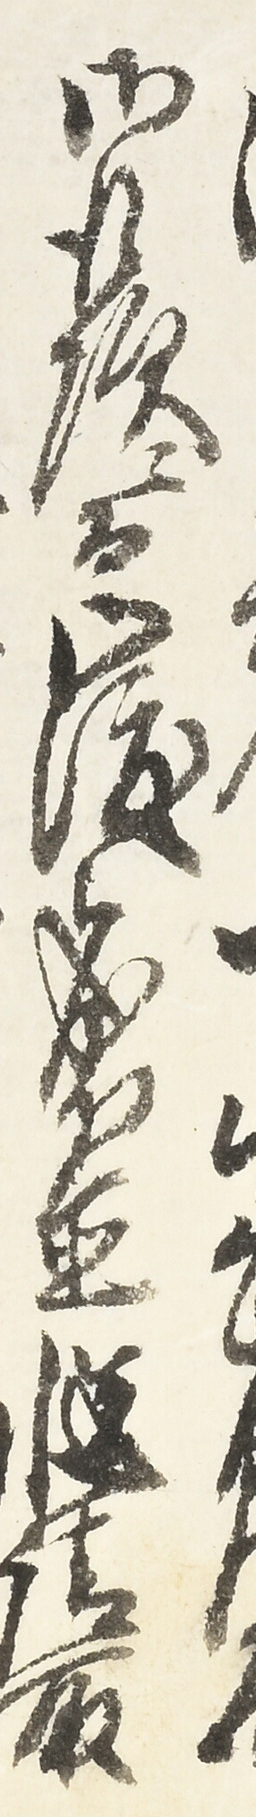御取次ニ而御渡被成下置慥請取
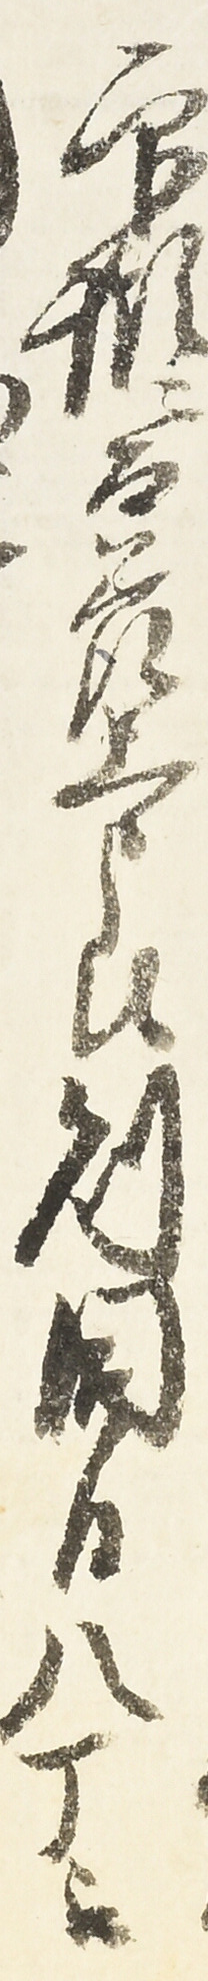印形ニ而差上申候則同日八丁江
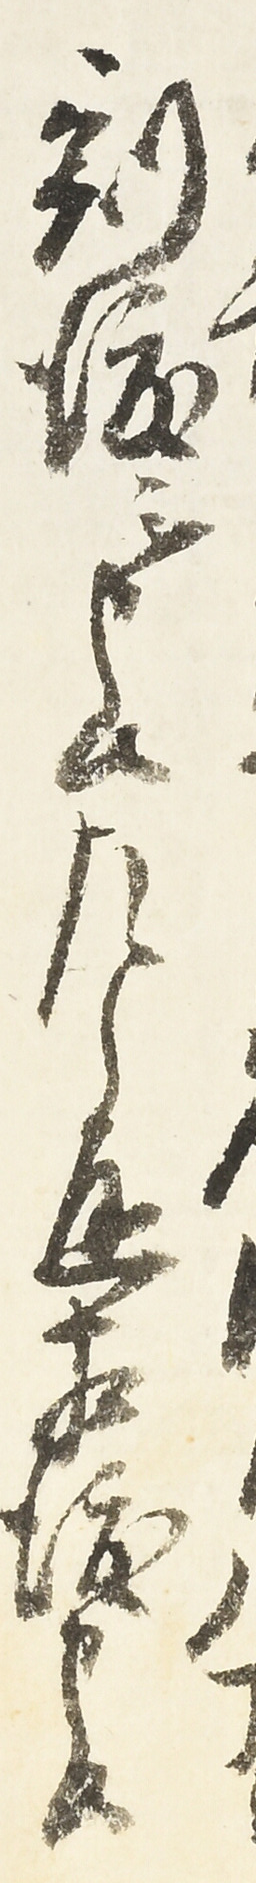割渡シ申候左之通相渡申候
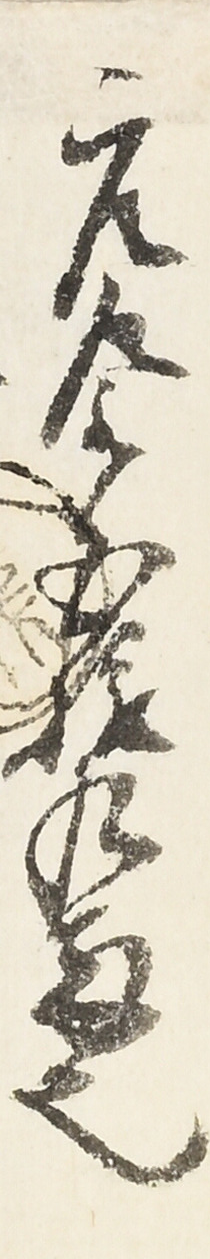元金五拾九両也
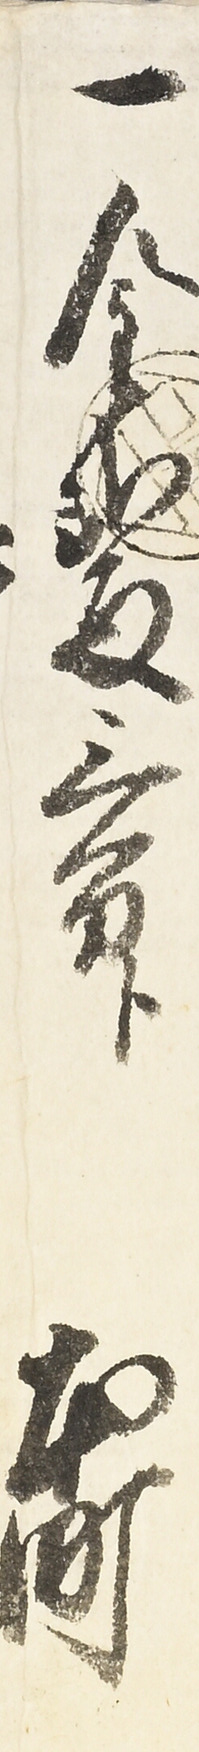一金弐両三分ト本町
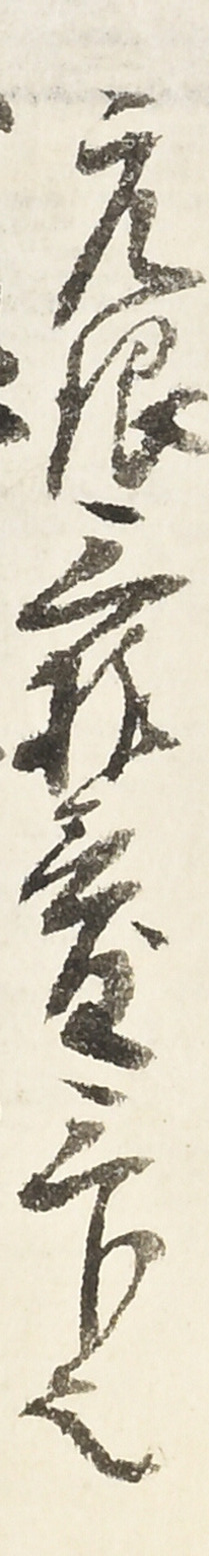元銀参拾壱匁三分也
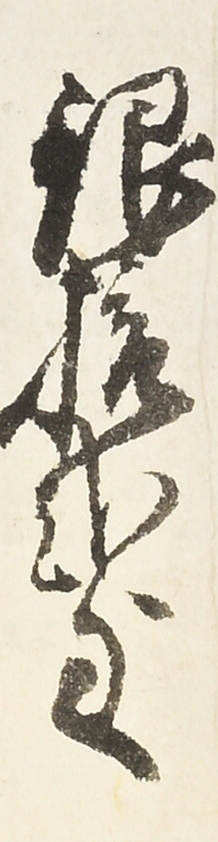銀拾弐匁
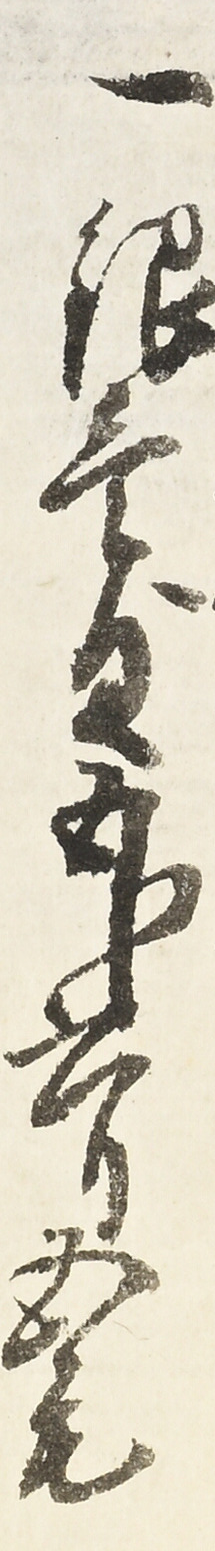一銀壱匁五分六厘五毛
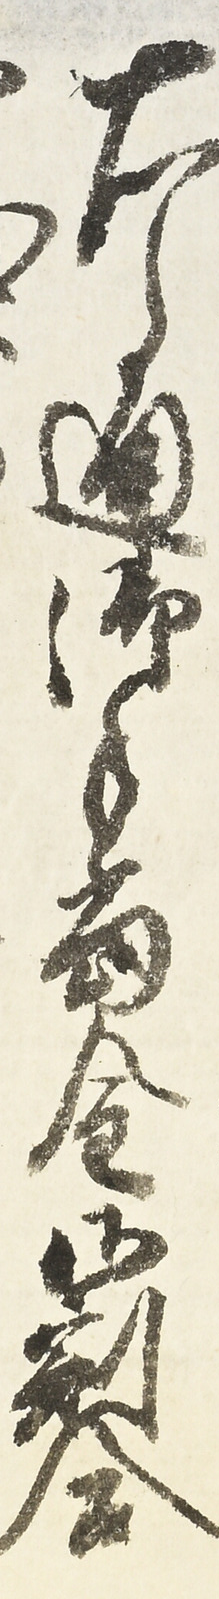右之通御手当金御割合
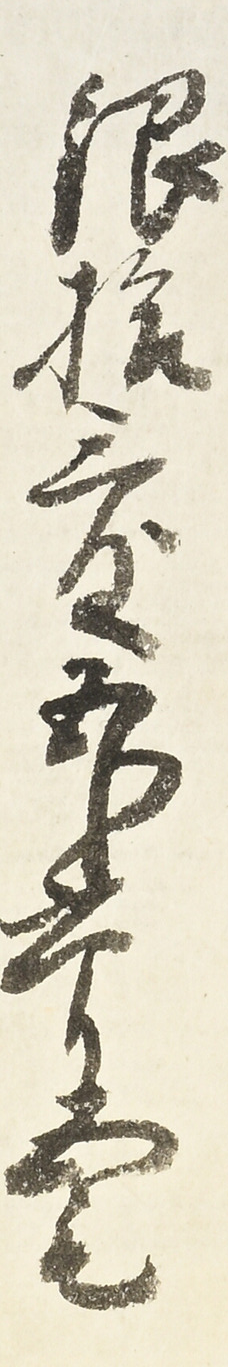銀拾三匁五分六厘五毛
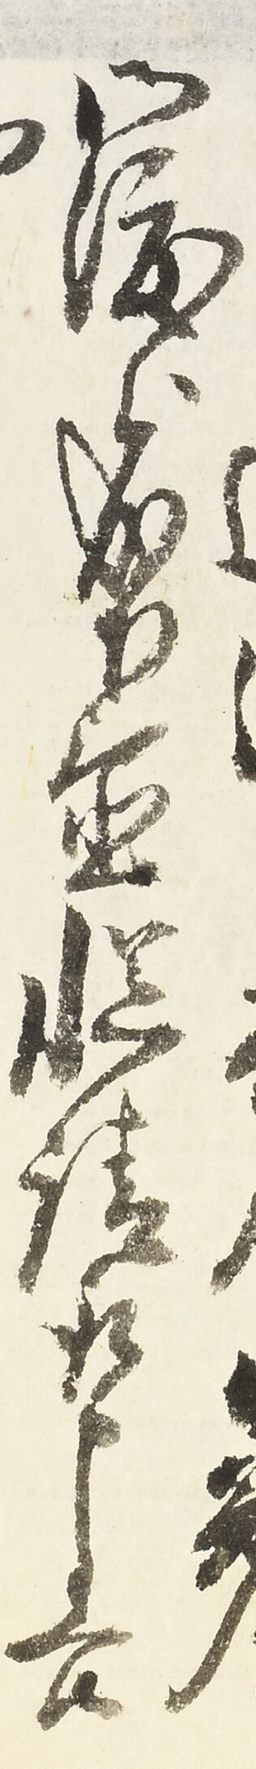御渡被成下置慥請取申上候
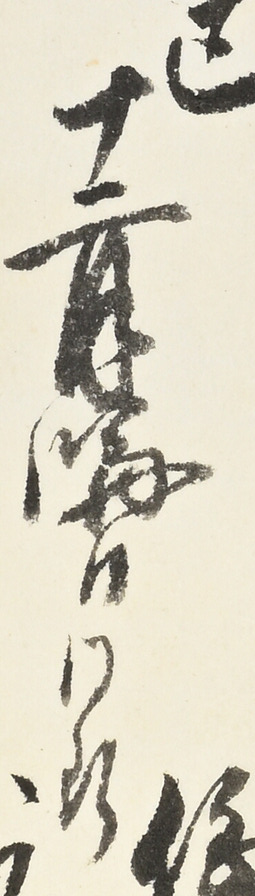十二月晦日同断

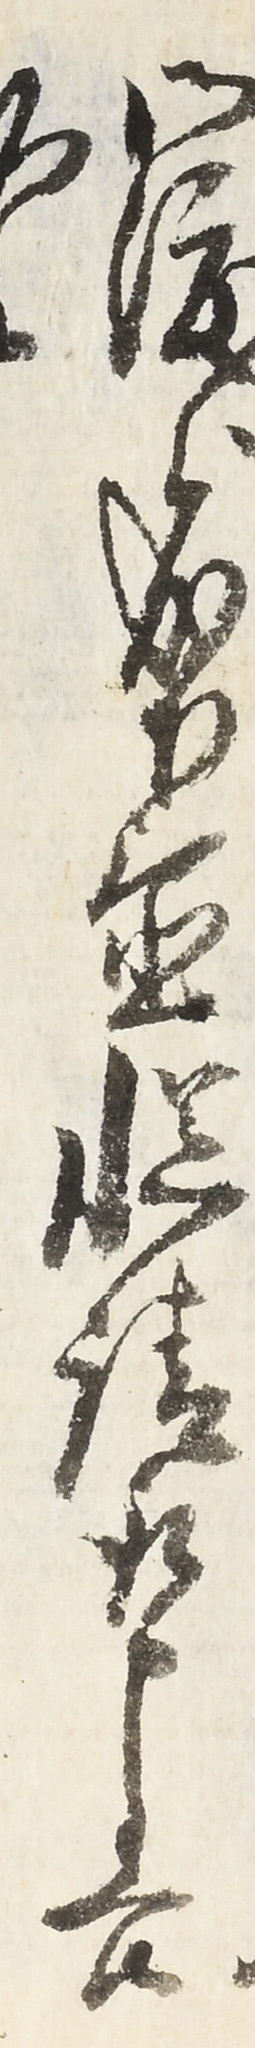御渡被成下置慥請取申上候
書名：御才覚金御利足割渡扣帳
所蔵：伊那市立高遠町図書館・合同会社AMANE
